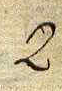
2
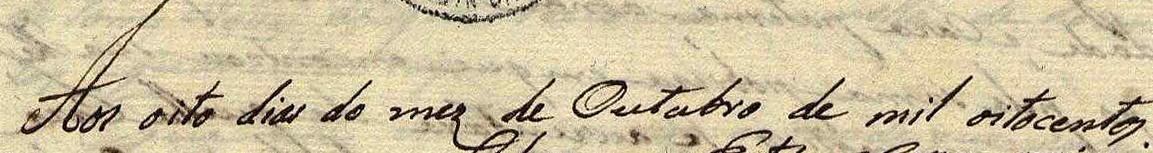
Aos oito dias do mez de Outubro de mil oitocentos
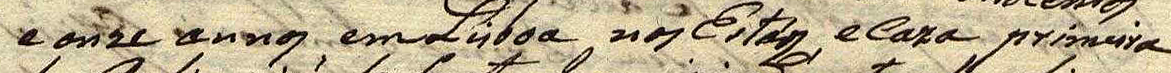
e onze annos, em Lisboa nos Estáos, e Caza primeira
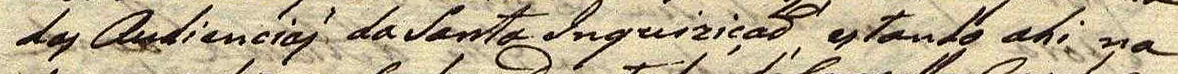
das Audiencias da Santa Inquiziçaõ, estando ahi na
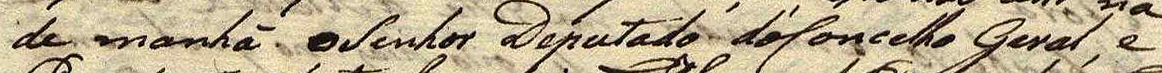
de manhã o Senhor Deputado do Concelho Geral, e
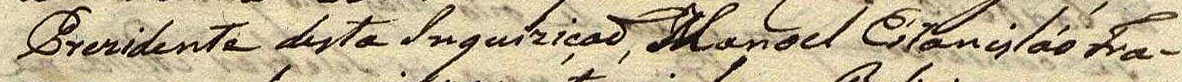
Prezidente desta Inquiziçaõ, Manoel Estanisláo Fra
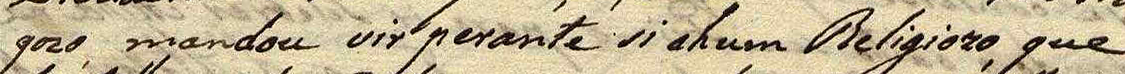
gozo mandou vir perante si a hum Religiozo, que
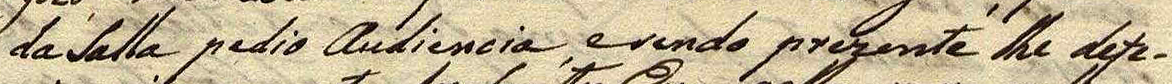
da Salla pedio Audiencia, e sendo prezente lhe defe
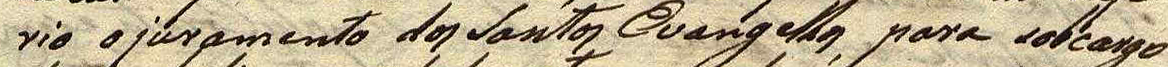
rio o juramento dos Santos Evangelhos, para sob cargo
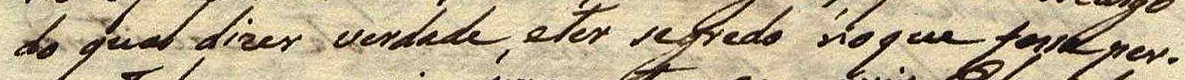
do qual dizer verdade, e ter segredo no que fosse per
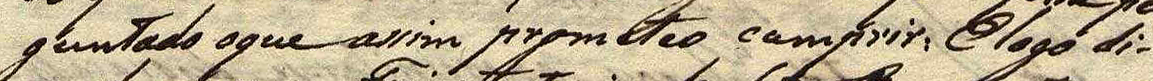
guntado o que assim prometeo cumprir: E logo di
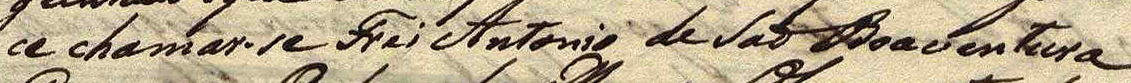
ce chamar-se Frei Antonio de Saõ Boaventura
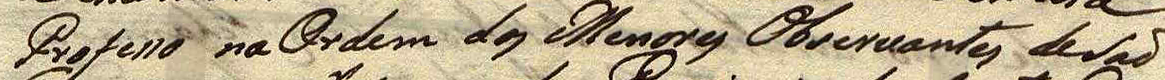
Professo na Ordem dos Menores Obseruantes de Saõ
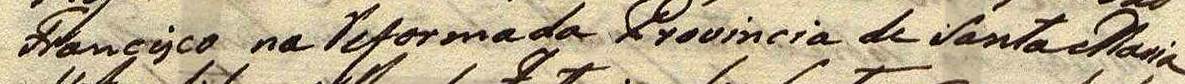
Francisco na Reformada Provincia de Santa Maria
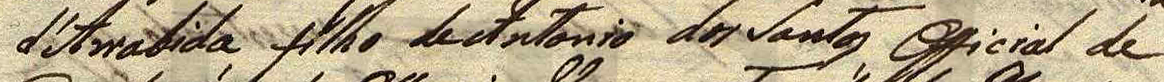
d'Arrabida, filho de Antonio dos Santos, Official de
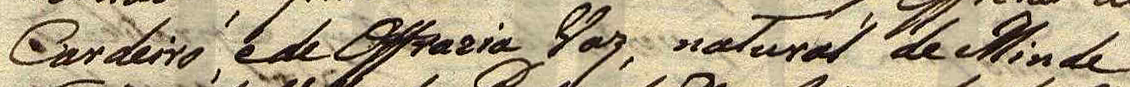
Cardeiro, e de Offrazia Vaz, natural de Minde
